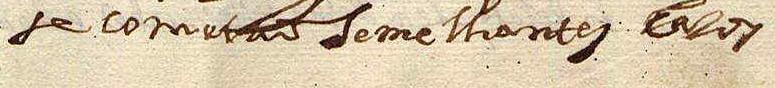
se cometaõ semelhantes cazos
